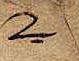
2
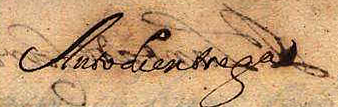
Auto de entrega
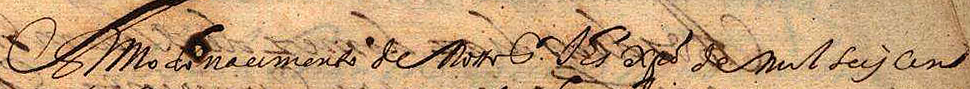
Anno do nacimento de Nosso sor Jhs̄ xpō de mil seiscen
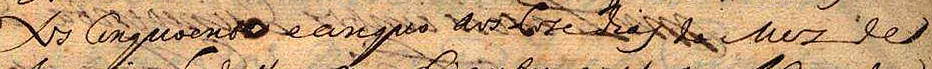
tos cinquoenta e cinquo aos doze dias do Mez de
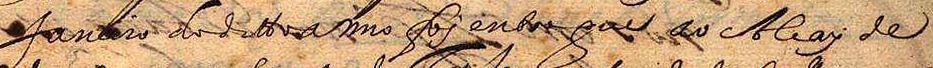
Janeiro do ditto anno foj entregue ao Alcayde
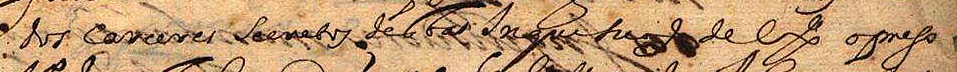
dos carceres secretos desta Inquisiçaõ de Lxa o preso
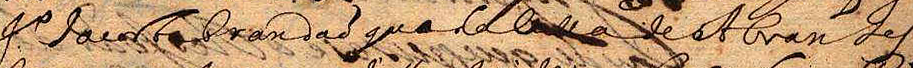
Jo da costa brandaõ que da Villa de Abrantes
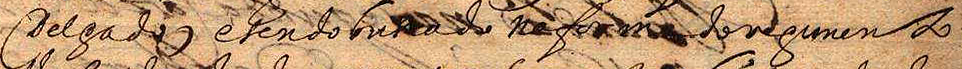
Delgado, e sendo buscado na forma do regimento
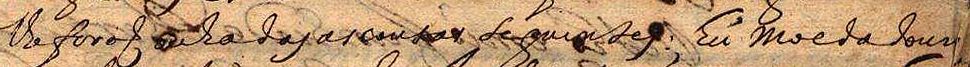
lhe foraõ achadas as cousas seguintes: hū moeda douro
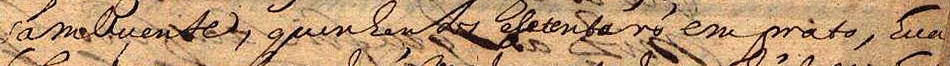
sam Vicente, quinhentos e setenta rs̄ em prata, hua
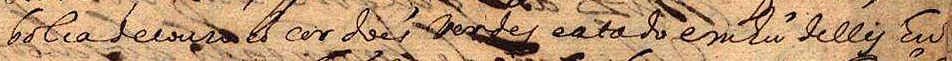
bolca de couro cō cordoẽs verdes e atado em hū delles hū
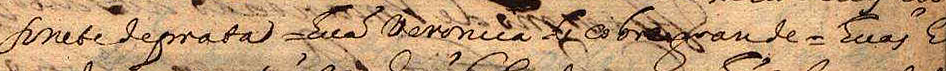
sinete de prata = huā veronica de cobre grande = huas̄ h
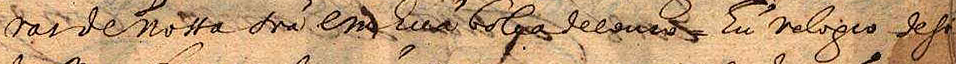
ras de nossa srā em huā bolça de couro = hū relogio de s
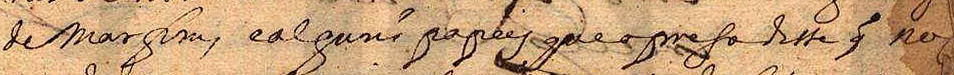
de marfim, e alguns papeis que o preso disse q̄ nos
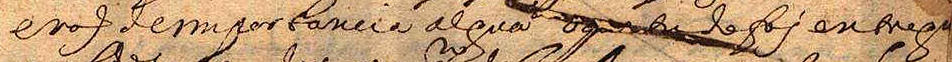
eraõ de importancia alguā o que tudo foj entregu
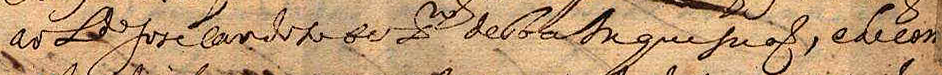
ao Ldo Joze Cardoso tezro desta Inquisicaõ, e de com
